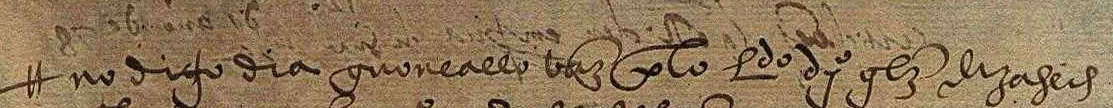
item no dito dia guonçallo vaz̄ p̄lo Ldo djo glz̄ dezaseis
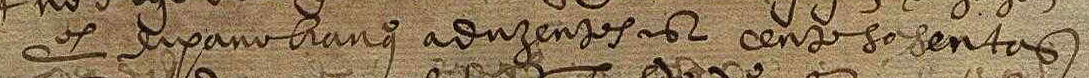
cos de pano branqo a duzentos rs cento sasenta rs
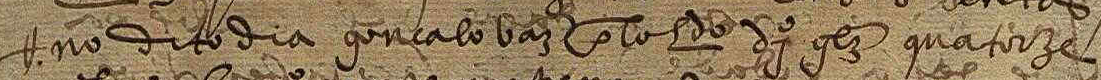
item no dito dia gonçalo vaz̄ p̄lo Ldo djo glz̄ quatorze
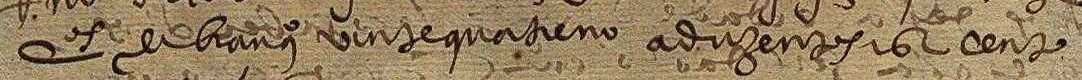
Cos de branqo vinte quatreno a duzentos rs cento
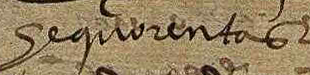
he quorenta rs
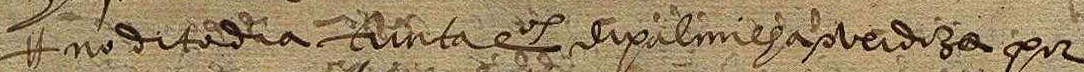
item no dito dia trinta cos de palmilha e verdozo por
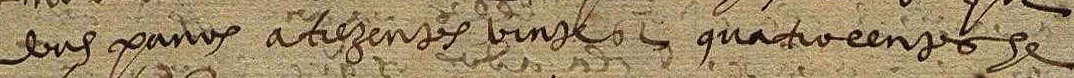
dous panos a trezentos vinte rs quatrocentos he
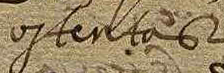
ojtenta rs
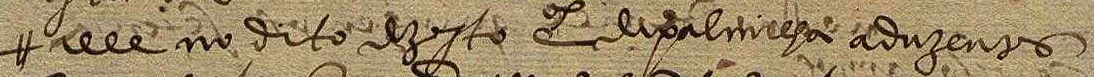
item elle no dito dezojto cos de palmilha a duzentos
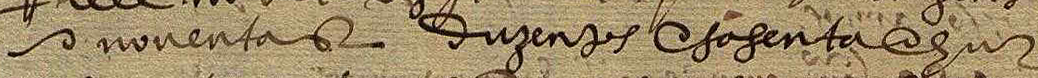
e nouenta rs duzentos e sasenta e hum
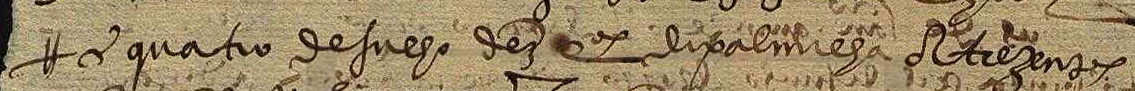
item ē quatro de Julho dez̄ cos de palmilha A trezentos
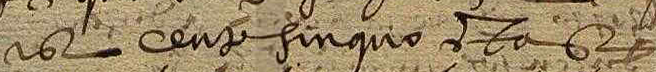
rs cento sinquoēta rs
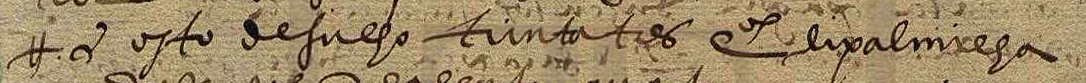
item ē ojto de Julho trinta tres cos de palmilha
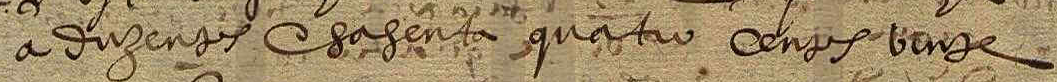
a duzentos e sasenta quatrocentos vinte
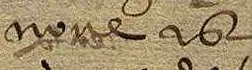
noue rs
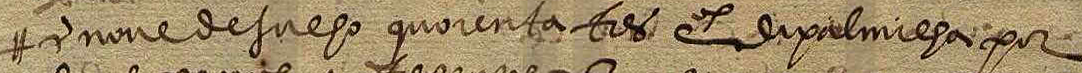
item ē noue de Julho quorenta tres cos de palmilha por
